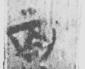百
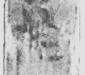廿=
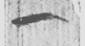一
